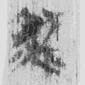然
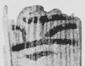亞（惡）
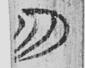勿
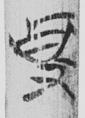○（變）
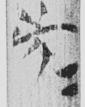人先
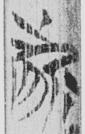所
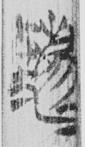灋
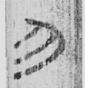勿
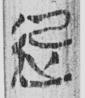○（起）
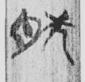肰（然）
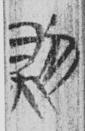則
